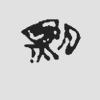則
